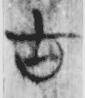古（故）
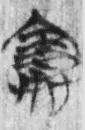賽
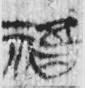禱
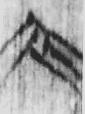太（太）
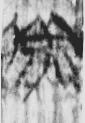備（佩）
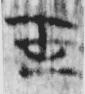玉
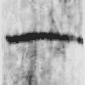一
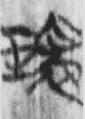環
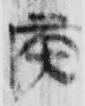矦（后）
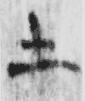土
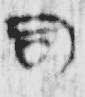司
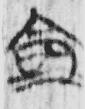命
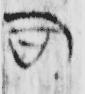司
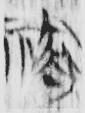○（禍）
